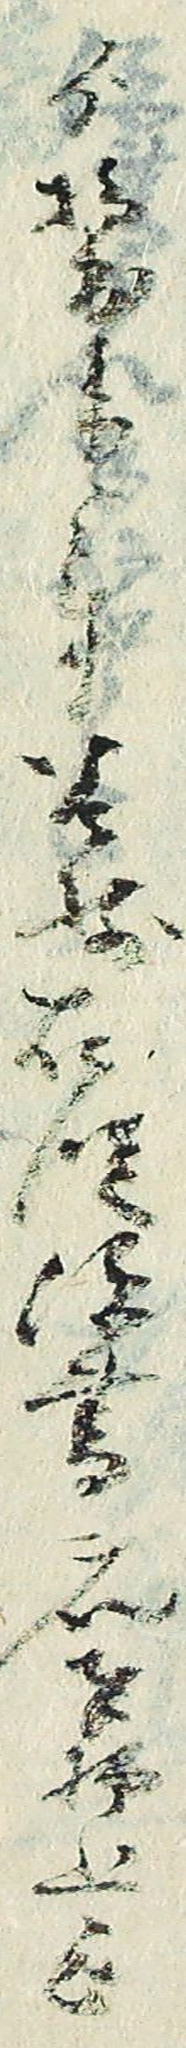ゟ指出来候に付取揃右段添書を以奉指上候以上
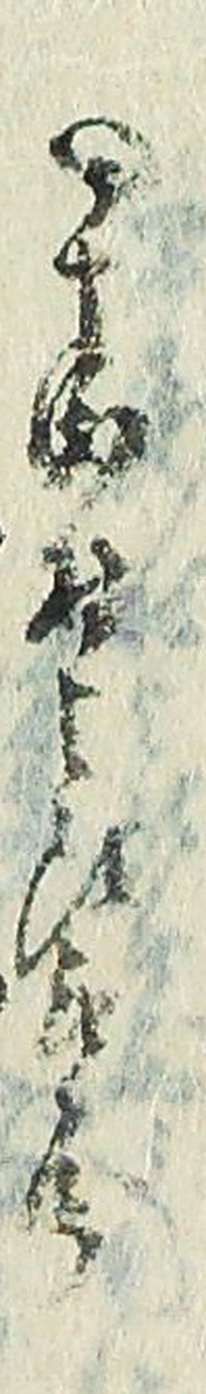早渕村与頭庄屋
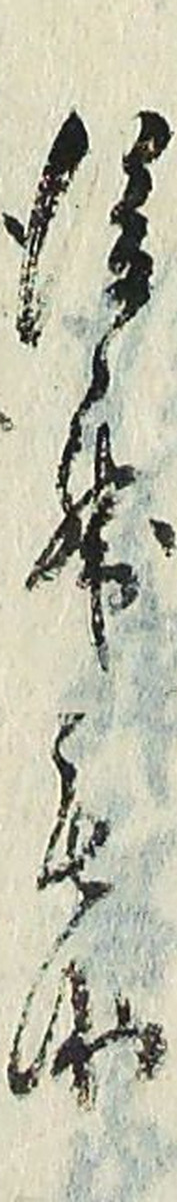後藤庄助
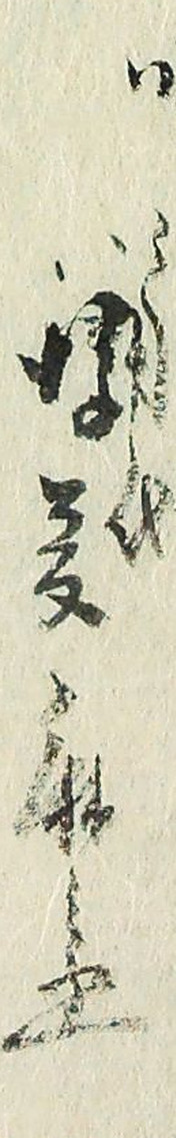後藤麻之丞
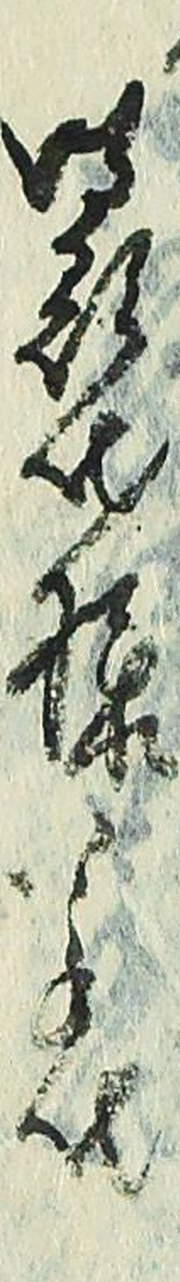御郡代様御手代
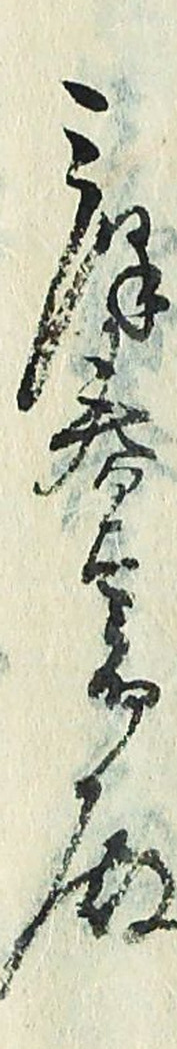三沢春太郎殿
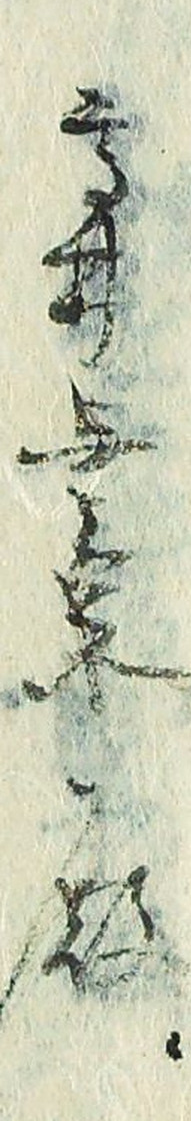高井与三兵衛殿
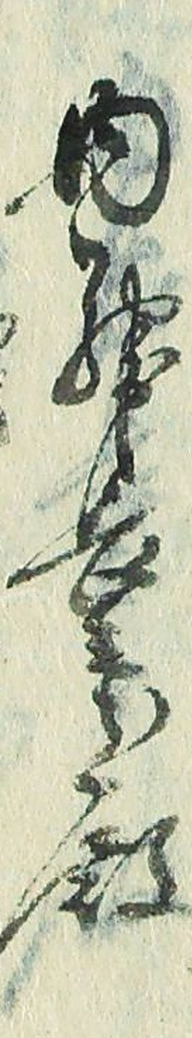内藤長三郎殿
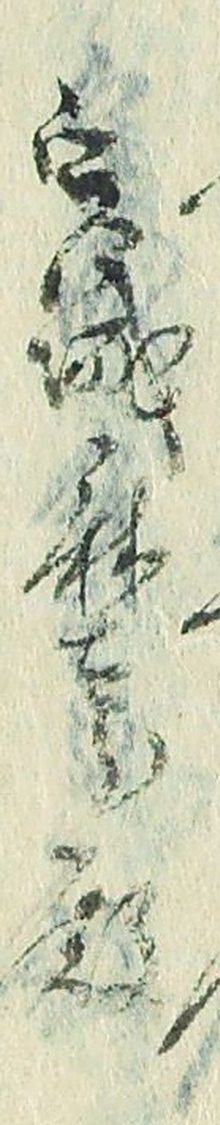宮城麻太郎殿
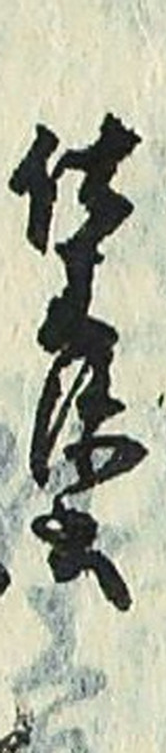仕上添書
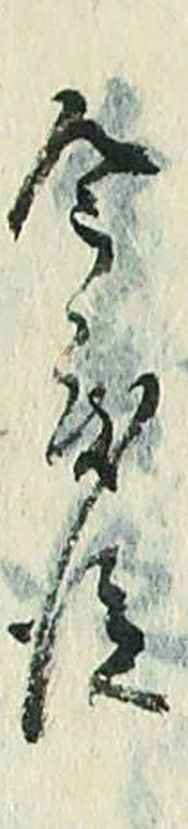今度従
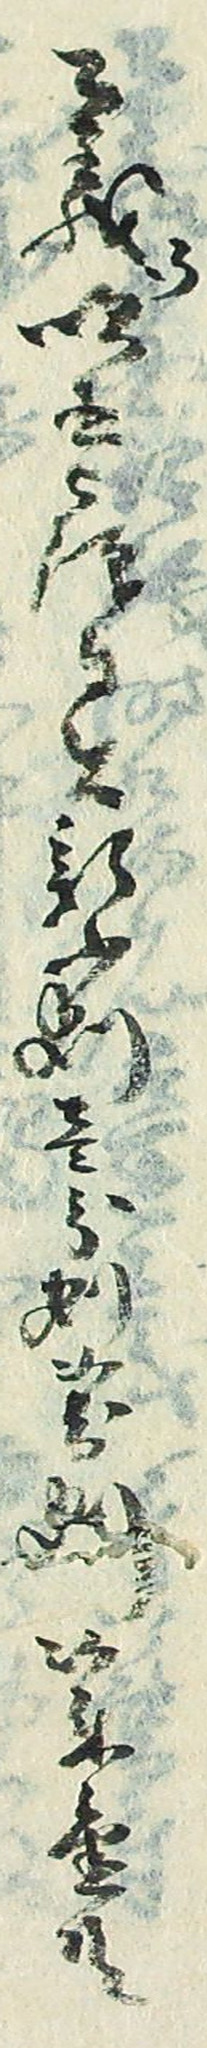公義御吹直被仰付候新小判壱分判弐分判弐朱金共
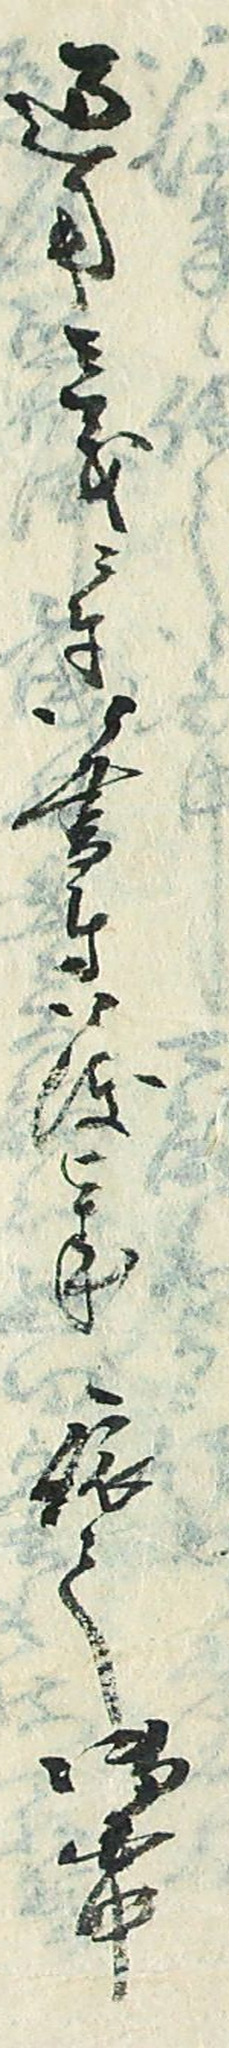通用之義に付御書付御渡被成候依之御国中

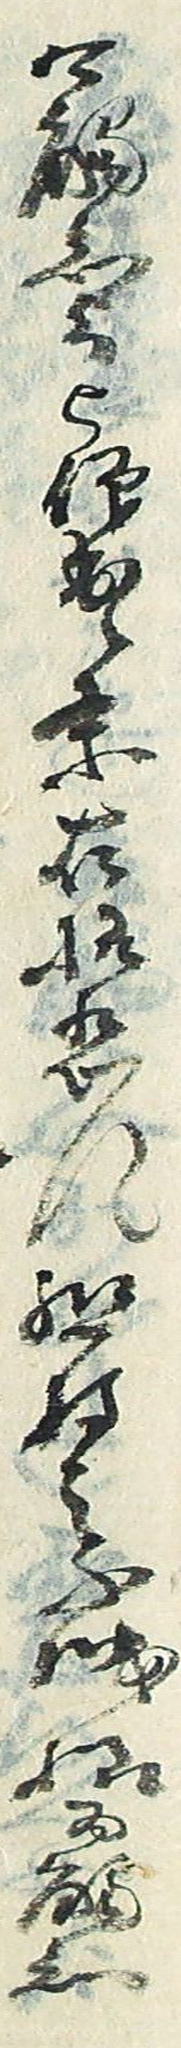可触知旨被仰出候条右様相心得組村々不洩様為触知
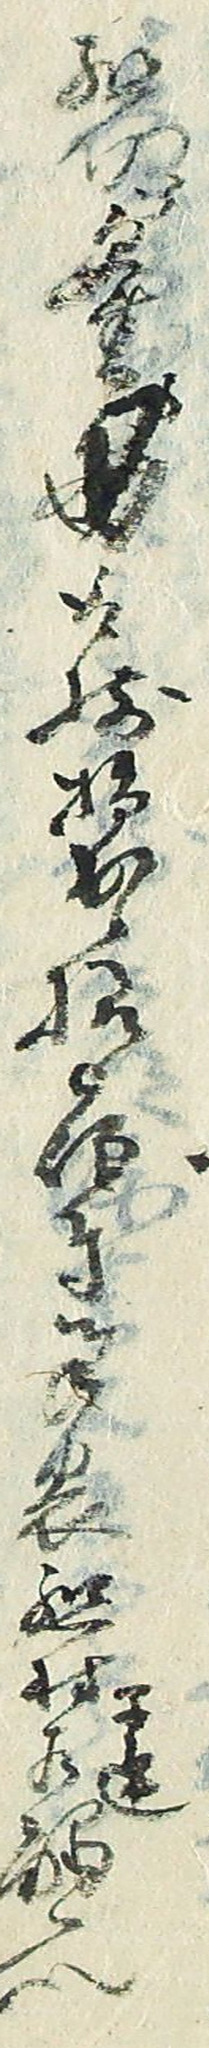組切御受書取揃指出候様被仰付奉畏組村早速相触候処
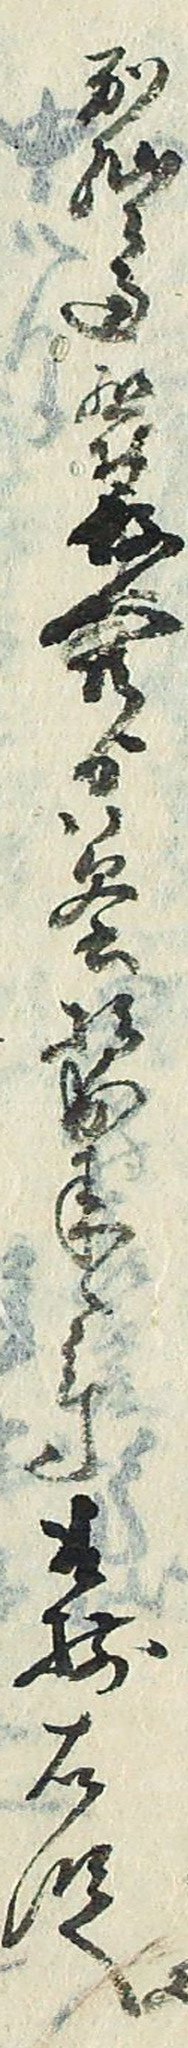別紙之通組村役人共ゟ御受書指出来候に付取揃右役人へ
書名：諸御用御□受書控
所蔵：鳴門教育大学 Naruto University of Education
